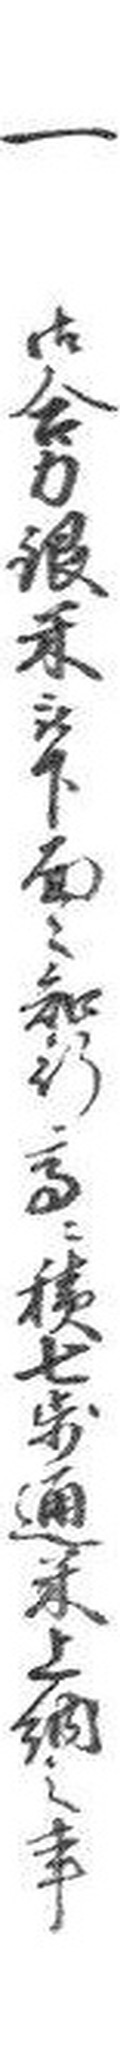一御合力銀米被下面々知行高ニ積七歩通米上納之事
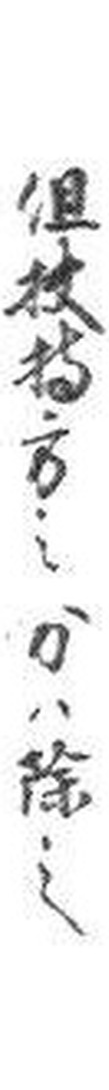但扶持方之分ハ除之
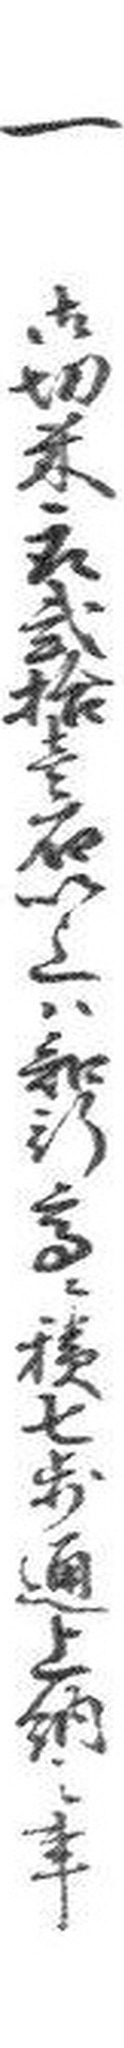一御切米取弐拾壱石以上ハ知行高ニ積七歩通上納之事
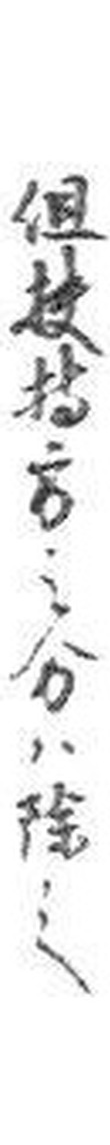但扶持方之分ハ除之
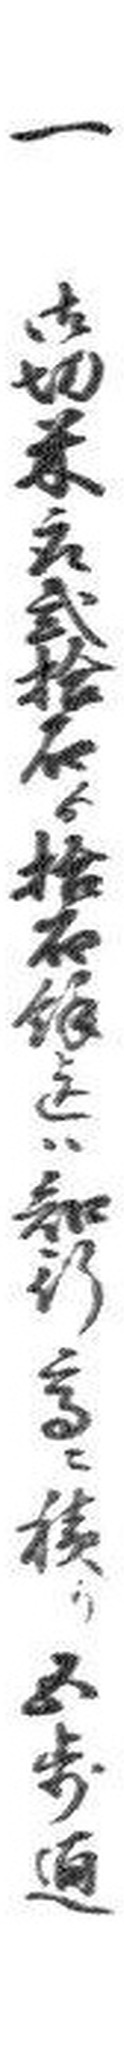一御切米取弐拾石ゟ拾石余迄ハ知行高ニ積リ五歩通
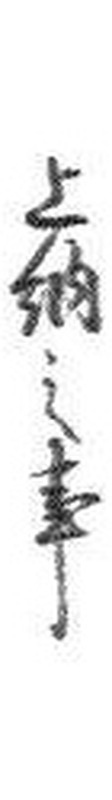上納之事
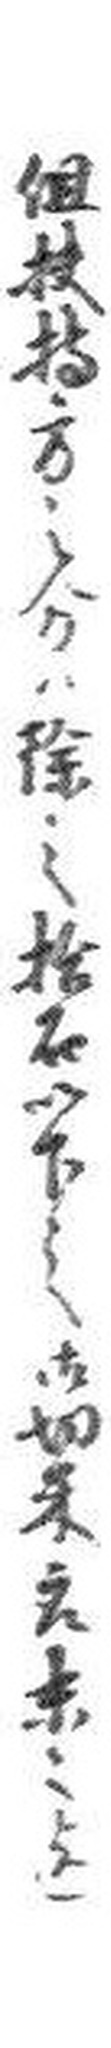但扶持方之分ハ除之拾石以下之御切米取末々迄
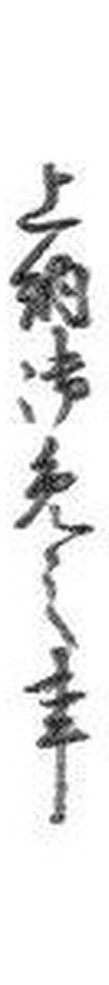上納御免之事
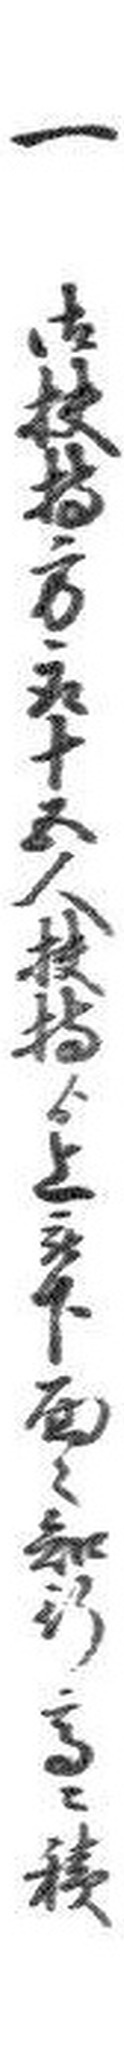一御扶持方取十五人扶持ゟ上被下面々知行高ニ積
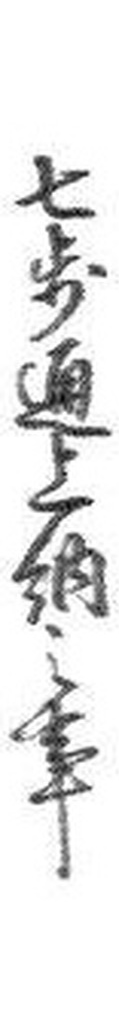七歩通上納之事
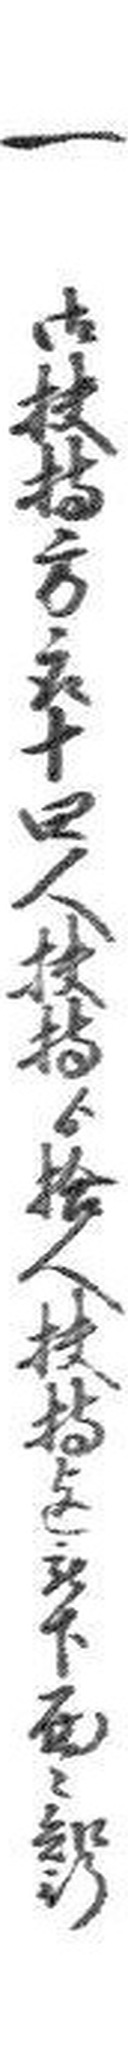一御扶持方取十四人扶持ゟ拾人扶持迄被下面々知行
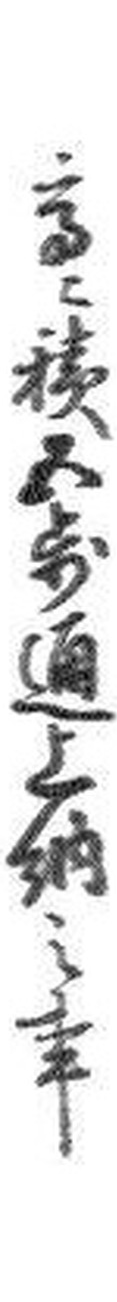高ニ積五歩通上納之事
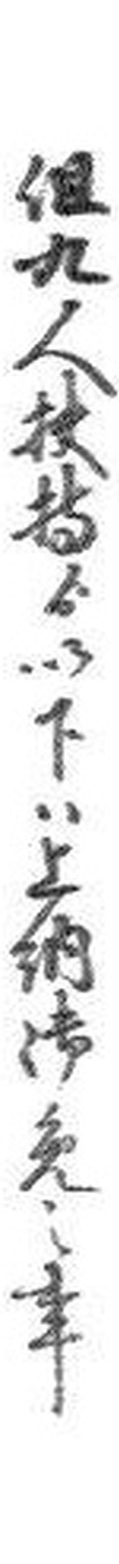但九人扶持ゟ以下ハ上納御免之事

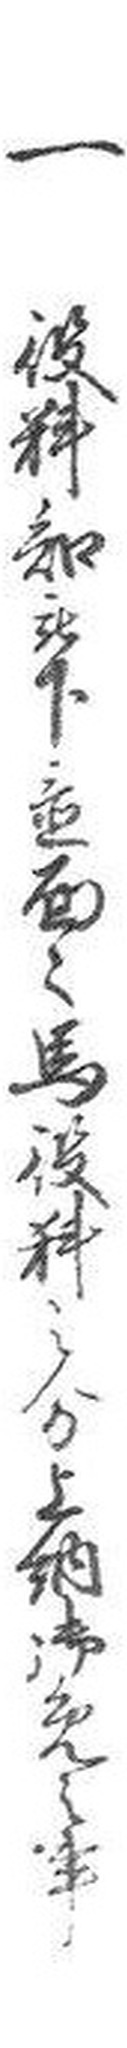一役料知被下置面々馬役料之分上納御免之事
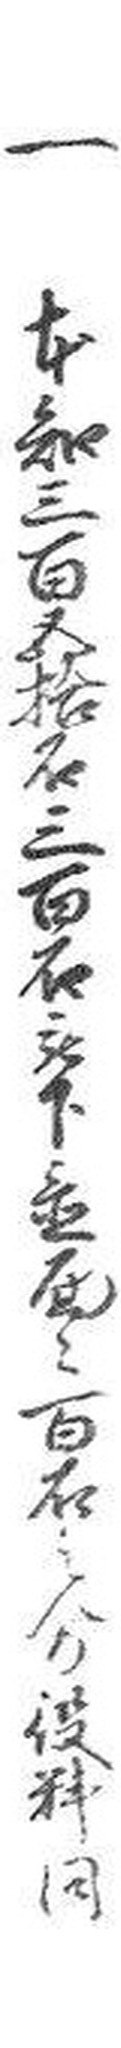一本知三百五拾石三百石被下置面々百石之分役料同
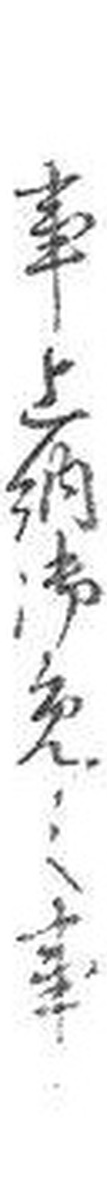事上納御免之事
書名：家譜 二十四 吉品公 従宝永三年到同五年
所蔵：福井県文書館 Fukui Prefectural Archives
